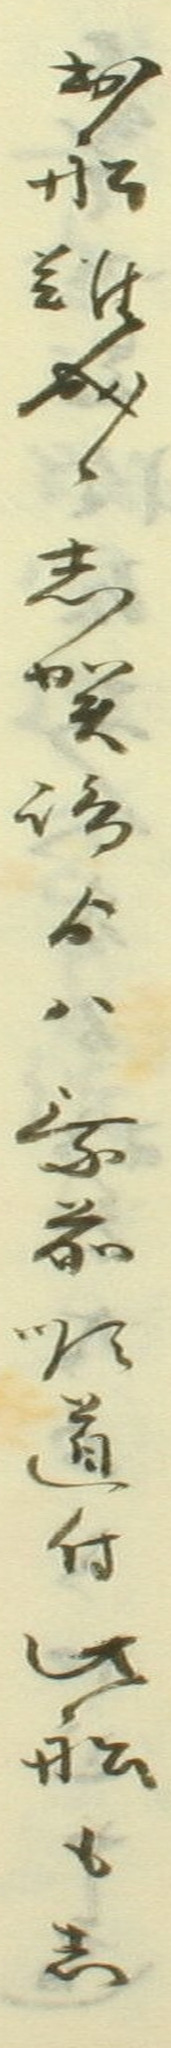出船難成候志賀島よりは乗前順道付此船も志
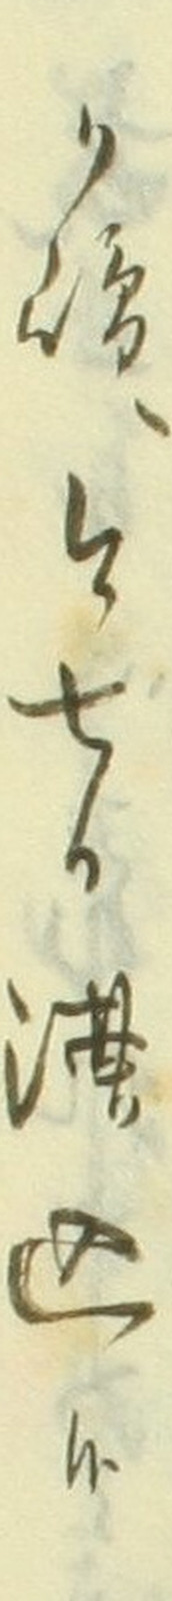か島へ今七日漕込候
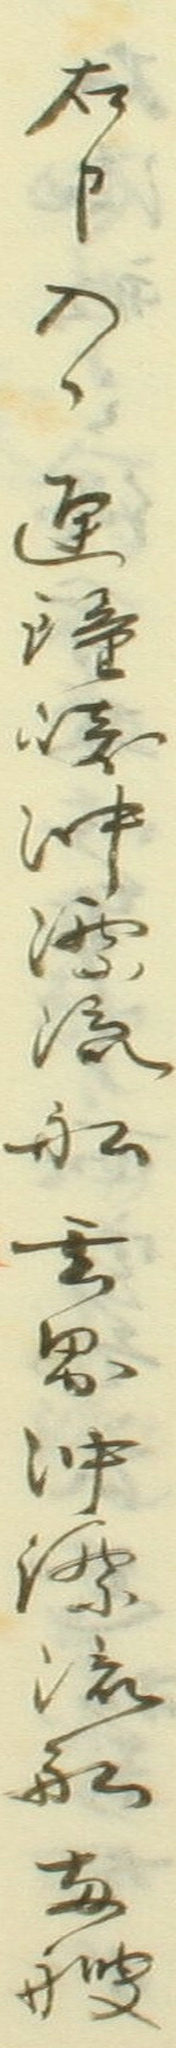一右申入候通鐘崎沖漂流船玄界沖漂流船両艘
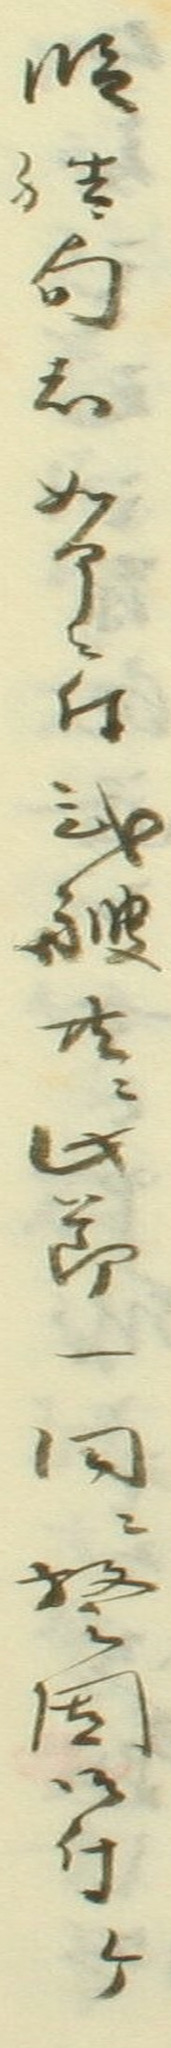段結局は如何に付弐艘共に此節一同に警固御付け
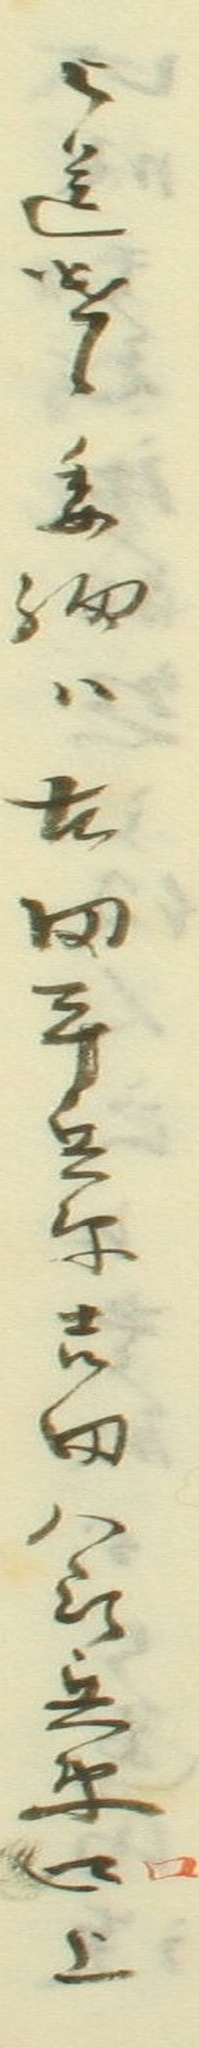被送遣候委細は古田平兵衛吉田八郎兵衛口上
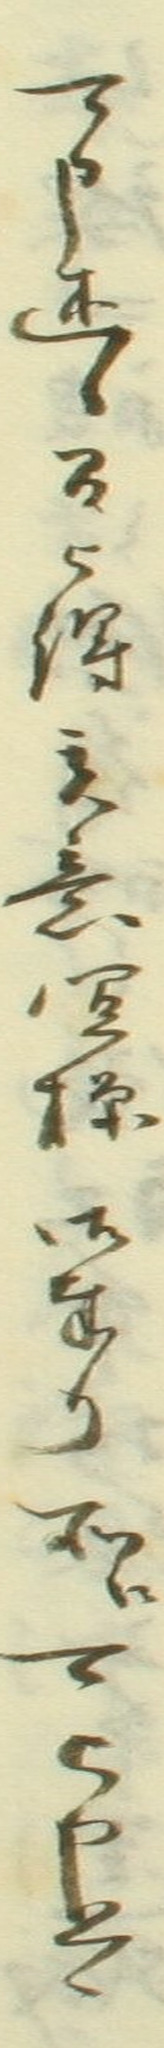可申述候間被得其意宜様御奉行所え可被申上候
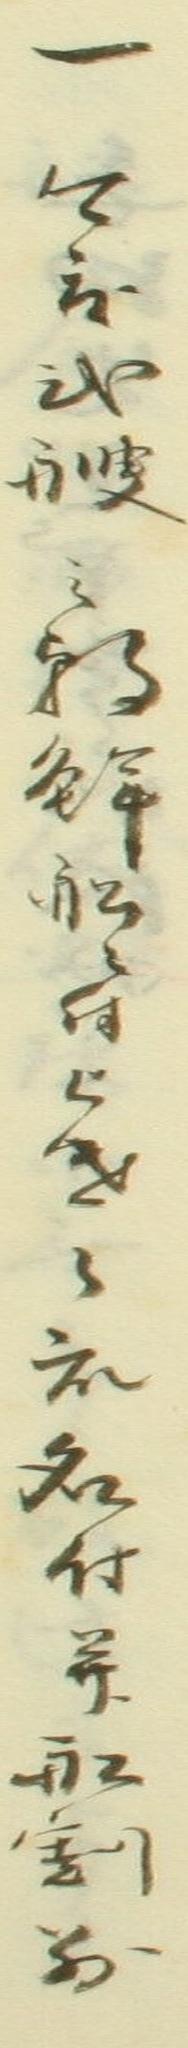一今度弐艘之朝鮮船に付被遣候衆名付并船割別
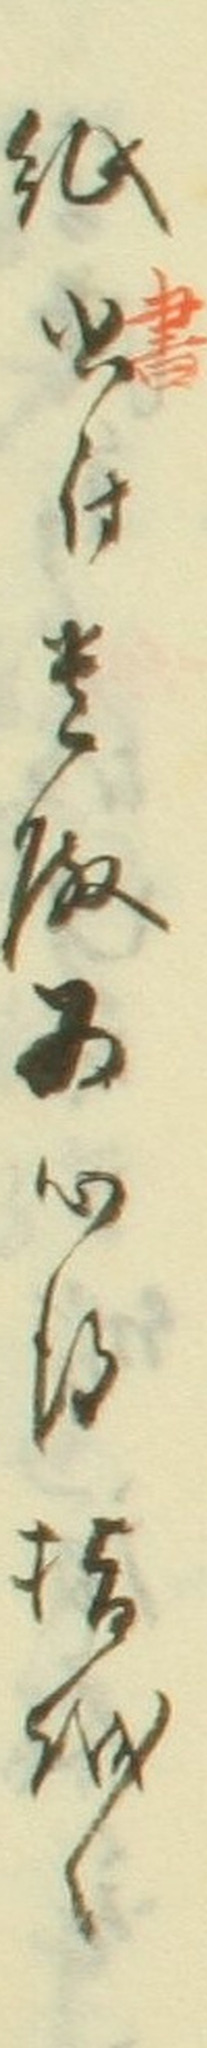紙書付貴殿可心得指越候
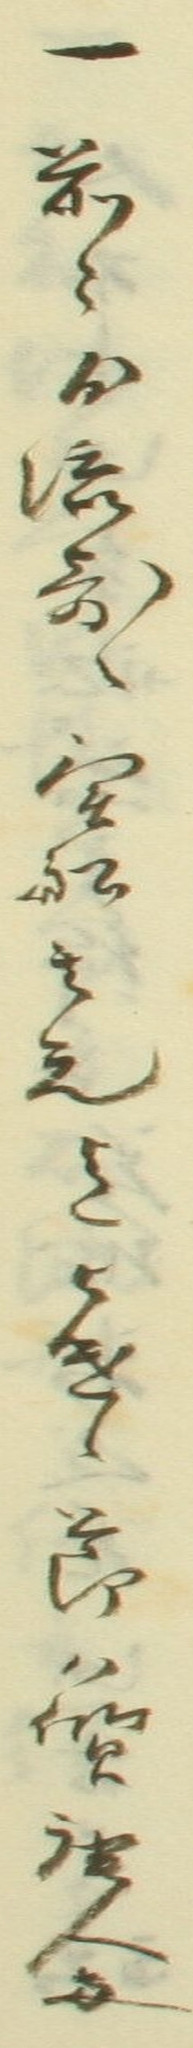一前々より流寄候実船其元迄被遣候節は質唐人両

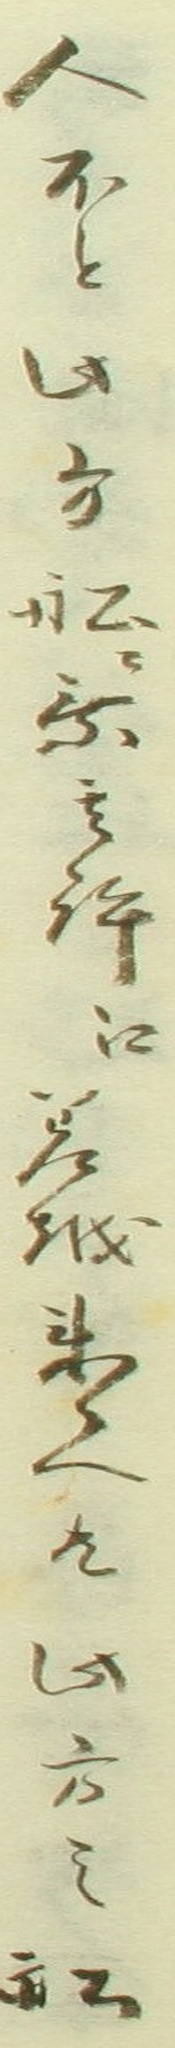人ほと此方船に乗其許え差越来候へ共此方之船
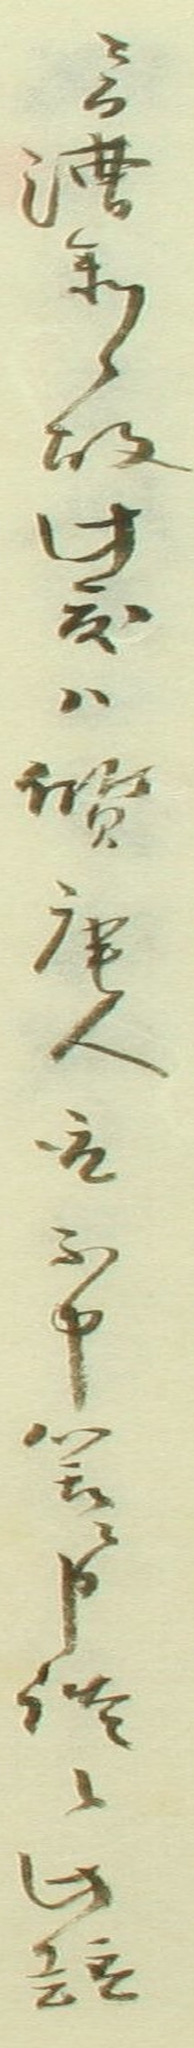にて漕参候故此度は質唐人取不申筈に申談候此趣
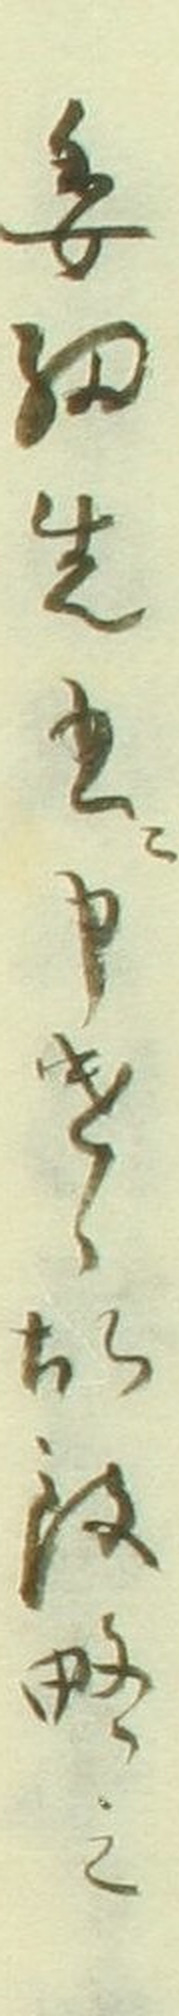委細先書に申遣候故致略之
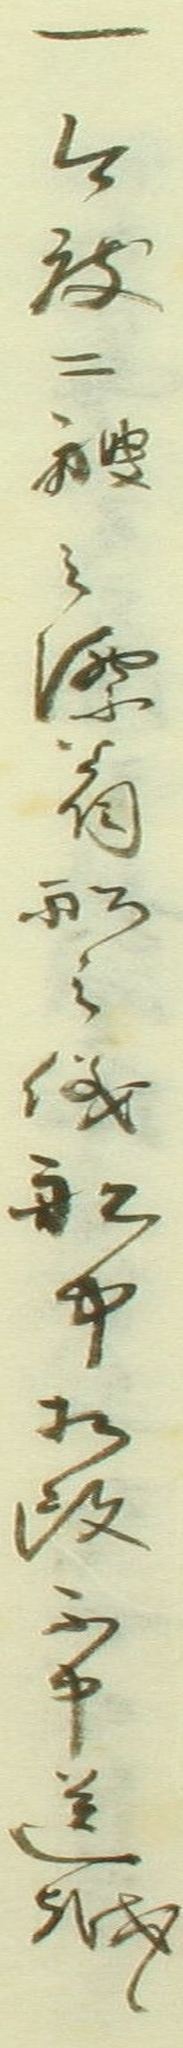一今度二艘之漂着船之儀船中相改不申送越候
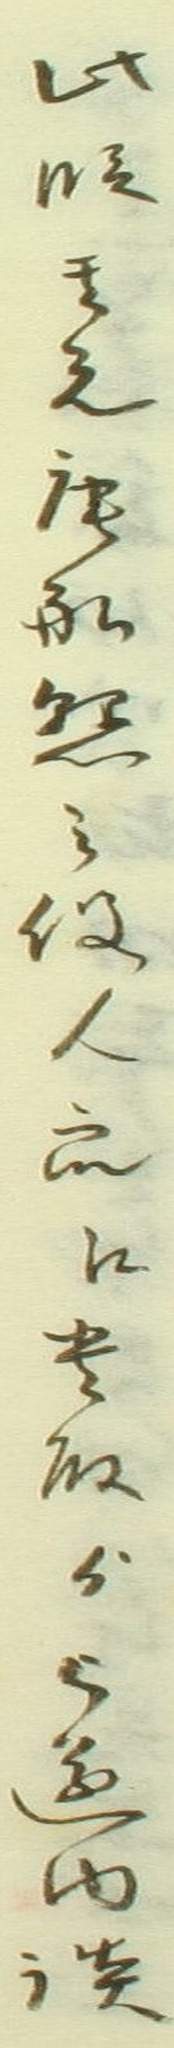此段其元唐船懸之役人衆え貴殿より遂内談
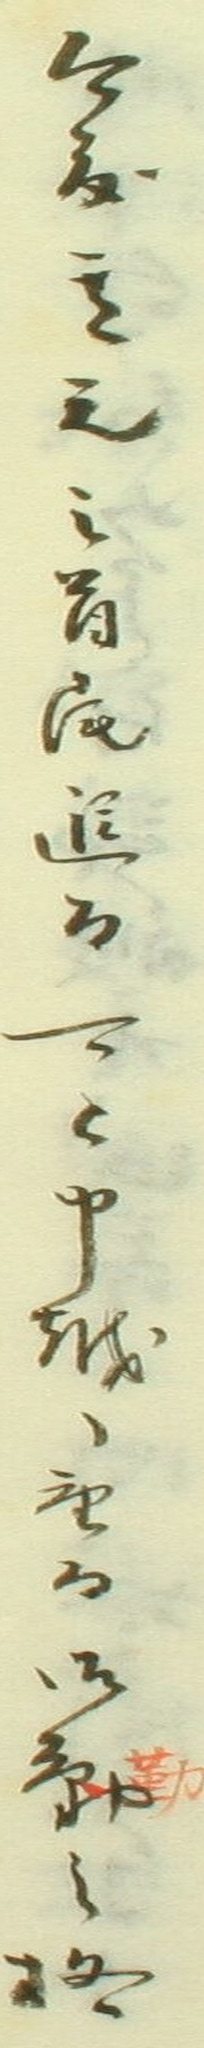今度其元之首尾追て可被申越候重て御勤之格
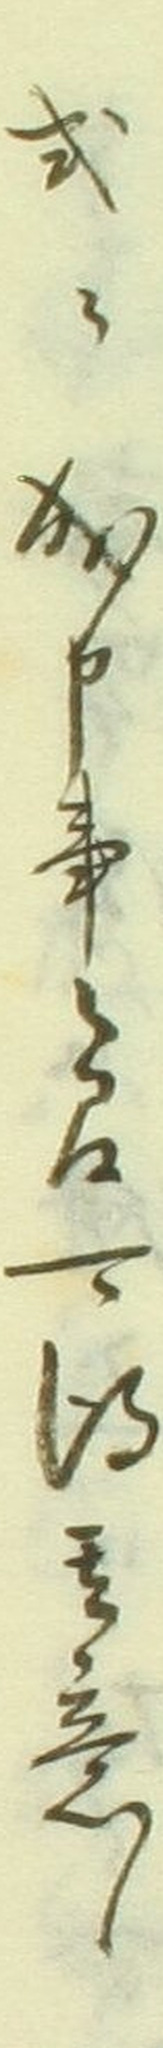式に成申事候間可得其意候
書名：朝鮮船御領内漂流記 坤
